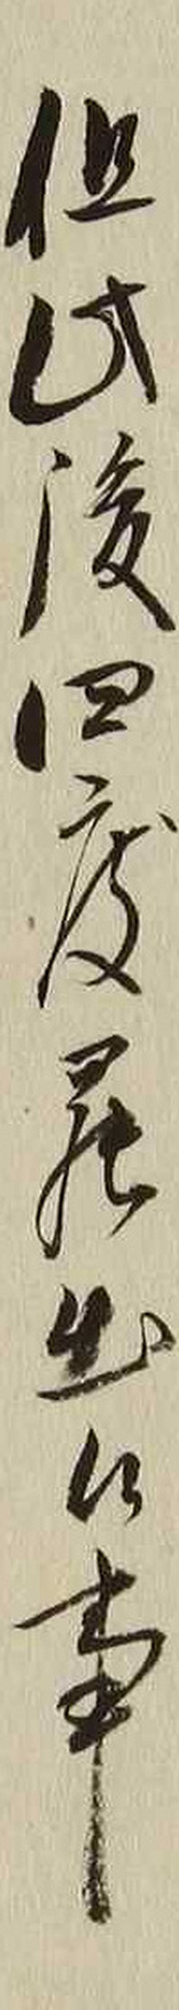但此後四度罷出候事
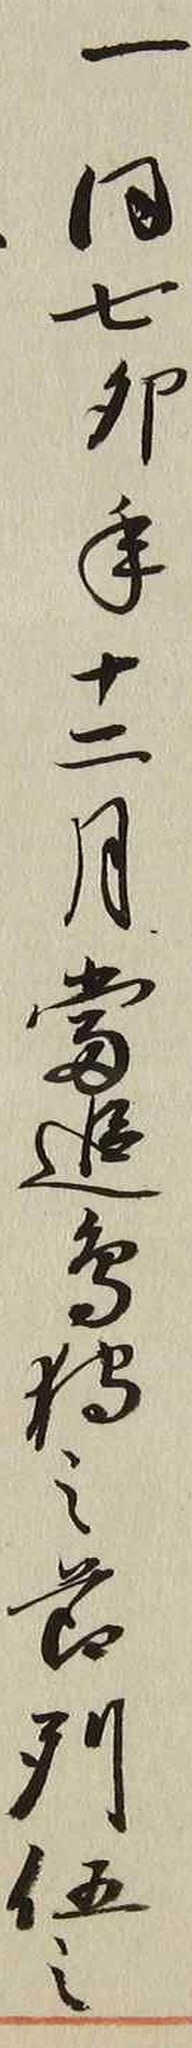一同七卯年十二月当追鳥狩之節列伍之
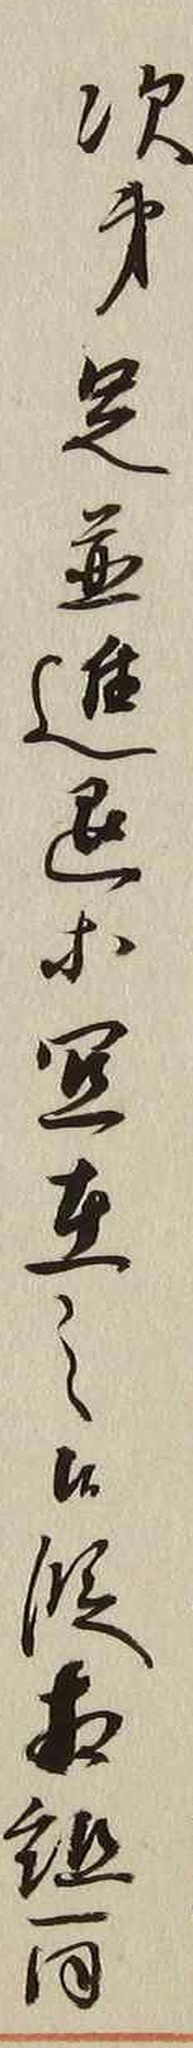次第足並進退等宜在之候段相組一同
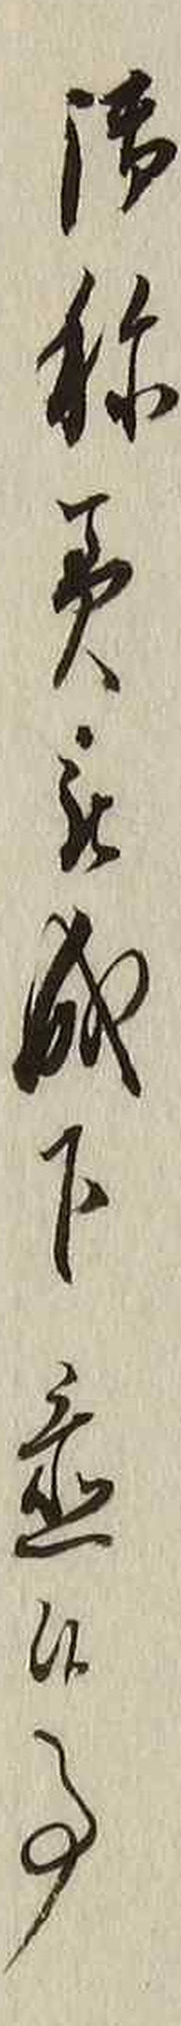御称美被成下置候事
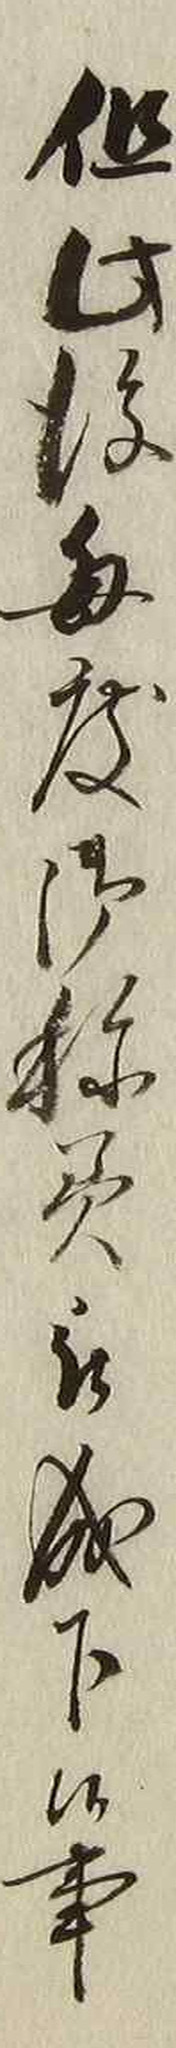但此後毎度御称美被成下候事
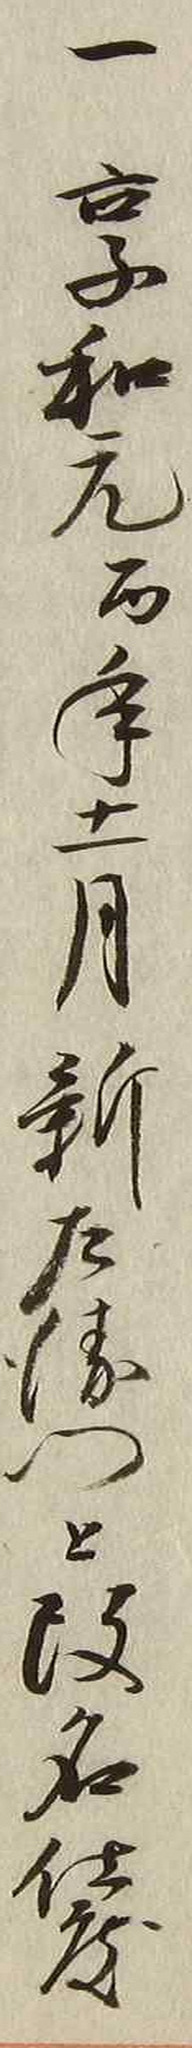一享和元酉年十一月新左衛門と改名仕度
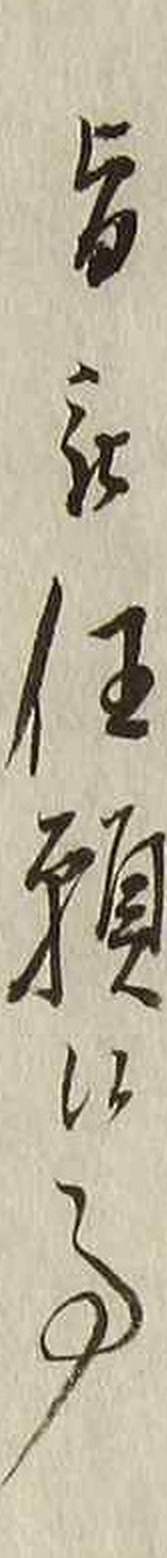旨被任願候事
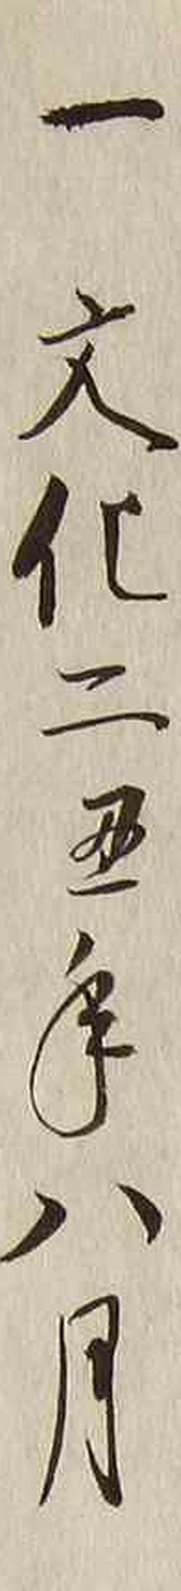一大化二丑年八月
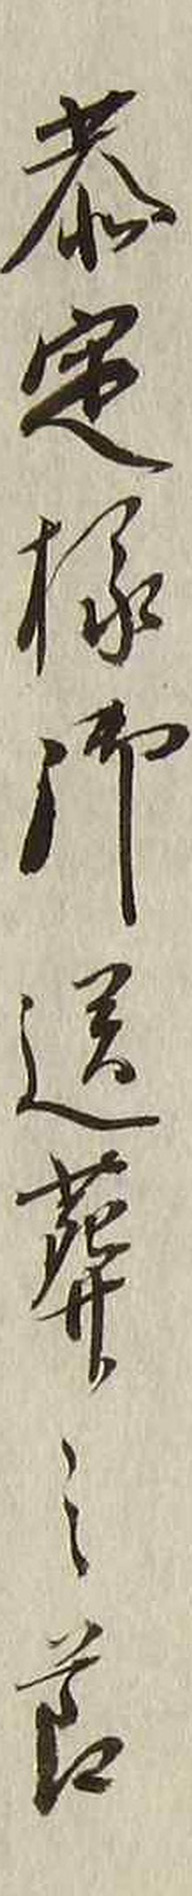恭定様御送葬之節
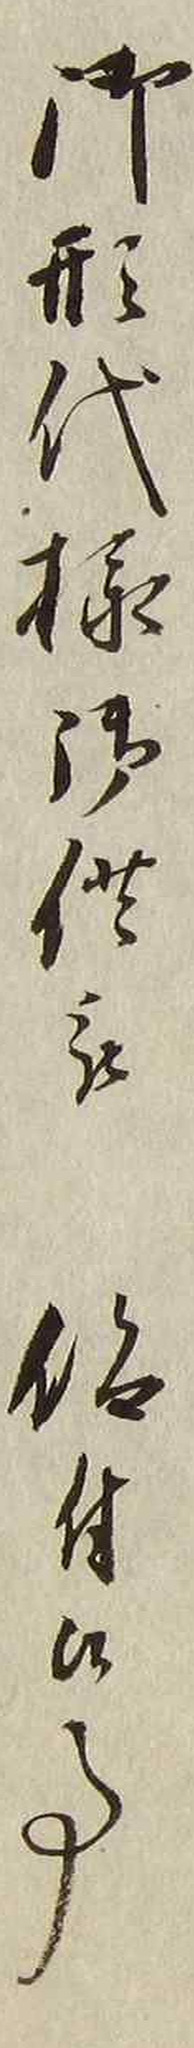御形代様御供被仰付候事
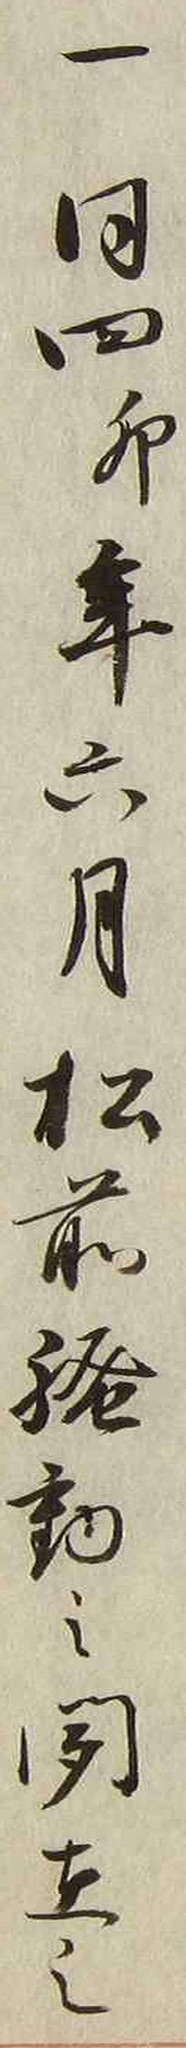一同四卯年六月松前騒動之聞在之

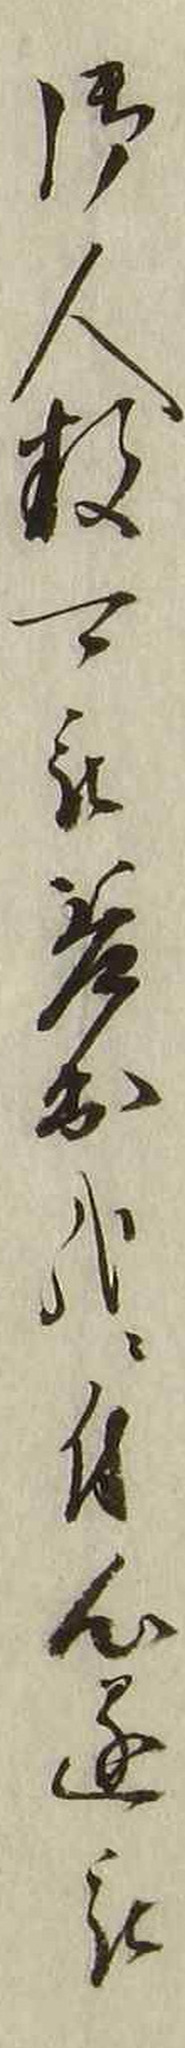御人数可被差出哉ニ付心遂被
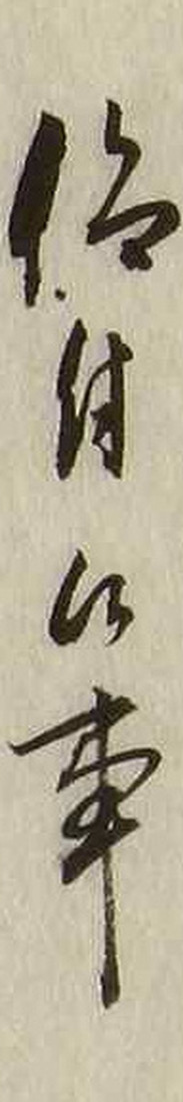仰付候事
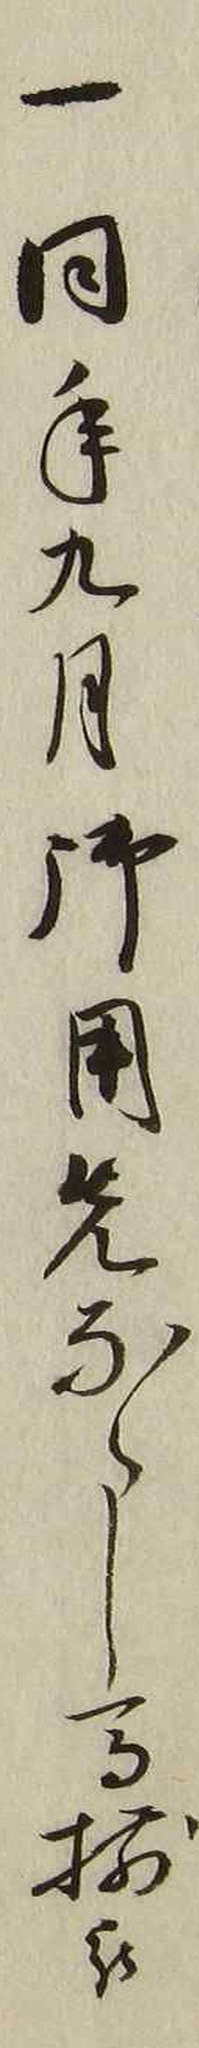一同年九月御用先ならし馬揃被
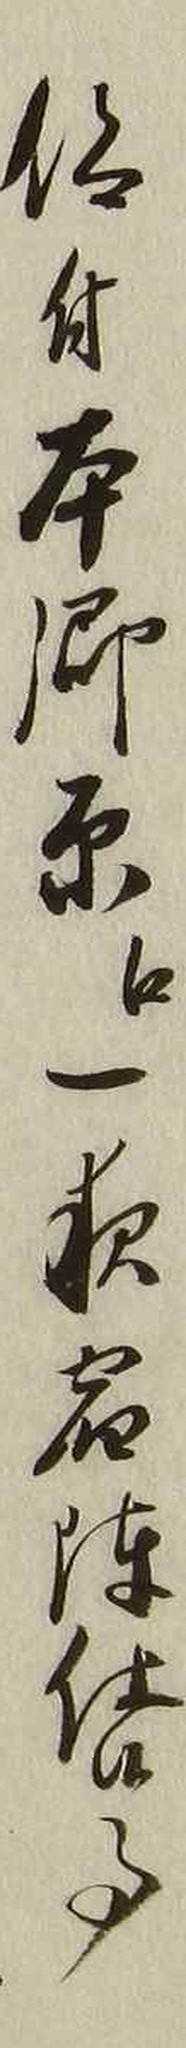仰付本郷原江一夜宿陣仕候事
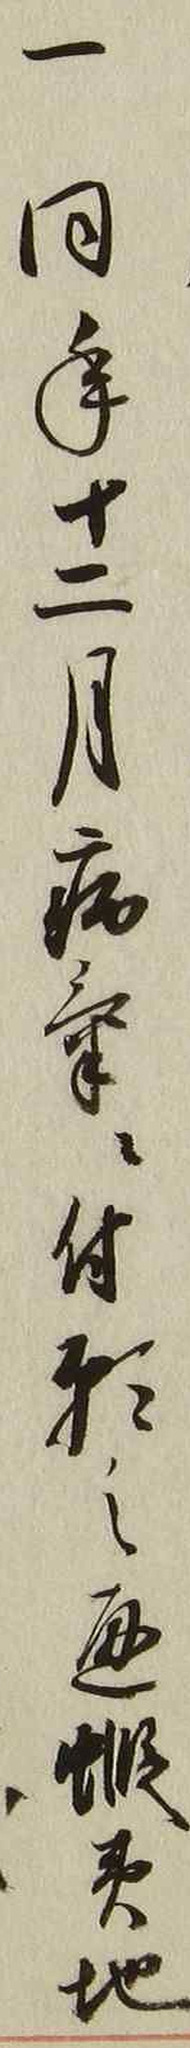一同年十二月病気ニ付願之通蝦夷地
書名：諸士系譜　巻之22　い之部22
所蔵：会津若松市立会津図書館
